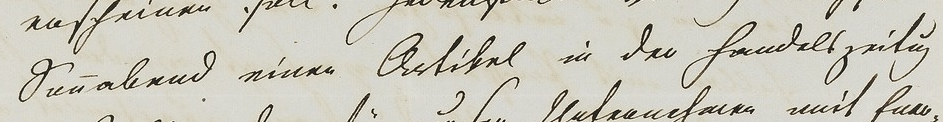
Sonnabend einen Artikel in der Handelszeitung
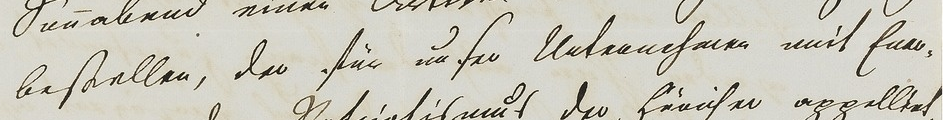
bestellen, der für unser Unternehmen mit Ener-
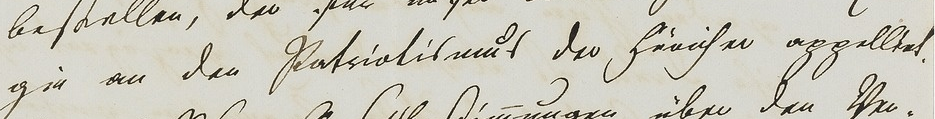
gie an den Patriotismus der Züricher appellirt.
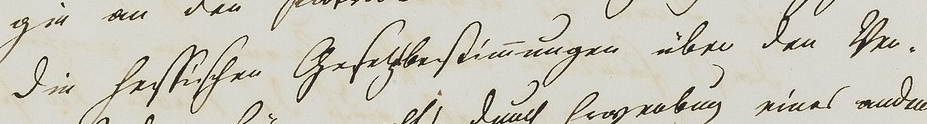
Die hessischen Gesetzesbestimmungen über den Ver-
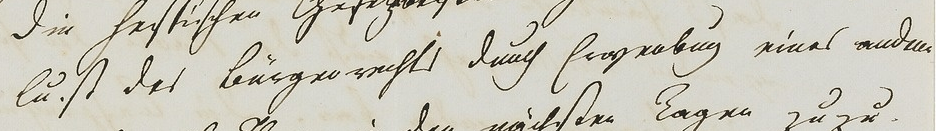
lust des Bürgerrechts durch Erwerbung eines andern
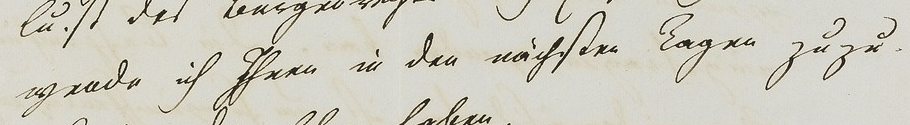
werde ich Ihnen in den nächsten Tagen zuzu-
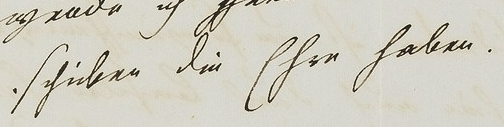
schicken die Ehre haben.
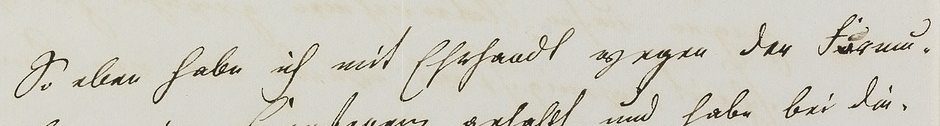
So eben habe ich mit Ehrhardt wegen der Formu-
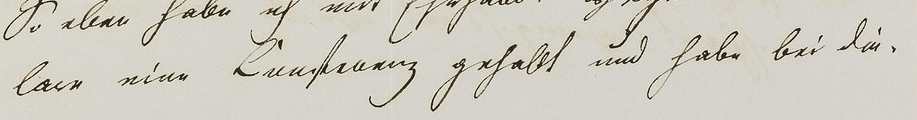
lare eine Conferenz gehabt und habe bei die-
